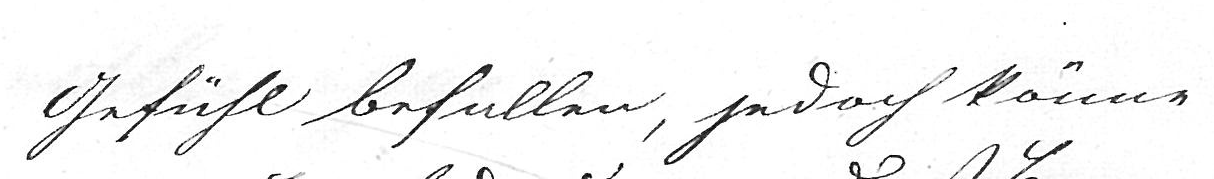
Gefühle befallen, jedoch könne
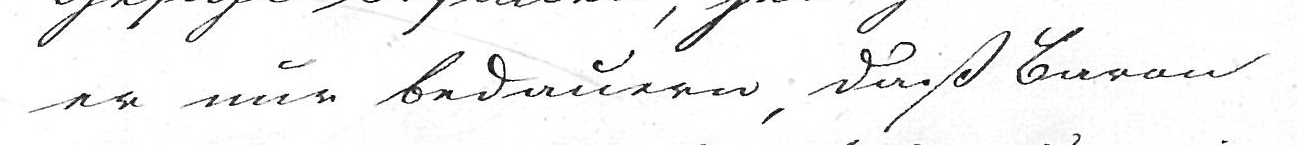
er nur bedauern, daß Baron
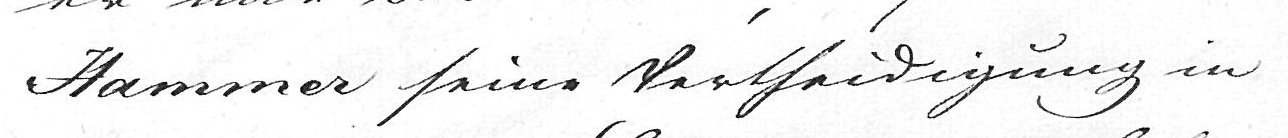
Hammer seine Vertheidigung in
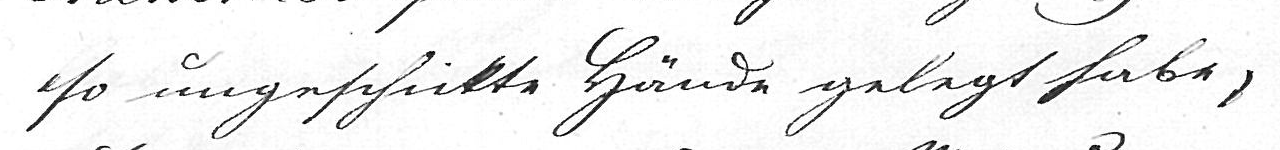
so ungeschickte Hände gelegt habe,
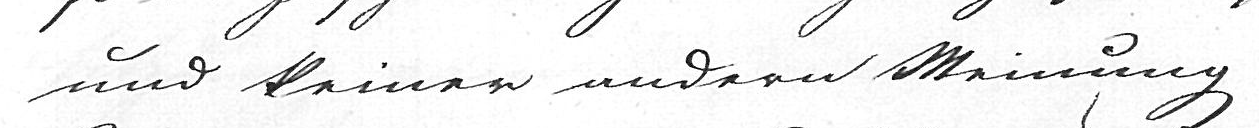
und keiner andern Meinung
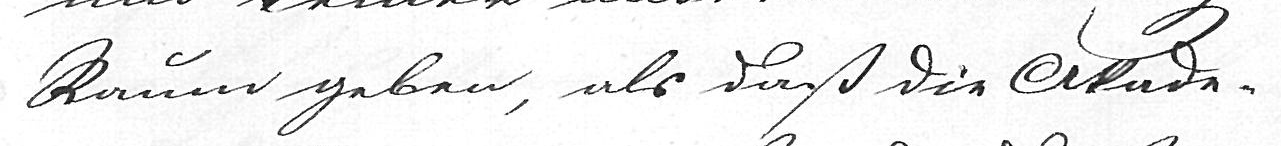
Raum geben, als daß die Akade-
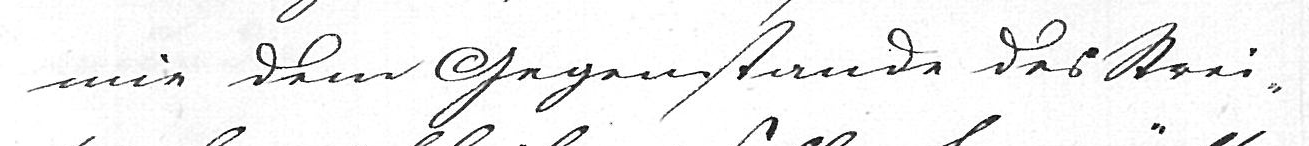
mie dem Gegenstande des Strei-
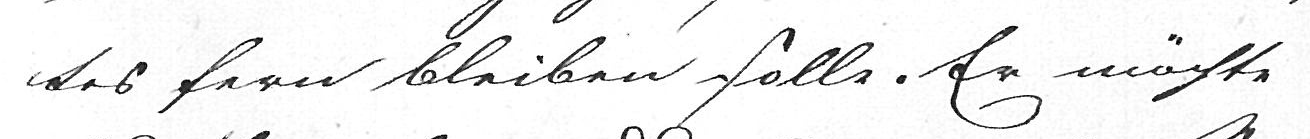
tes fern bleiben solle. Er möchte
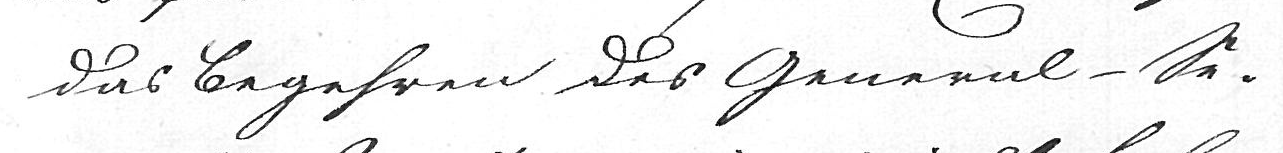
das Begehren des General-Se-
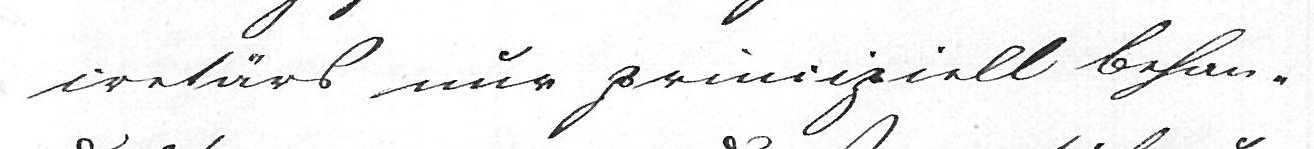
cretär nur principiell behan-
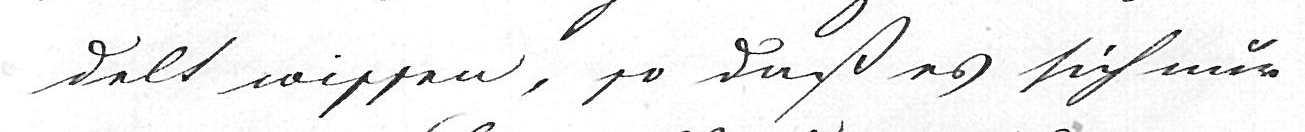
delt wissen, so daß es sich nur
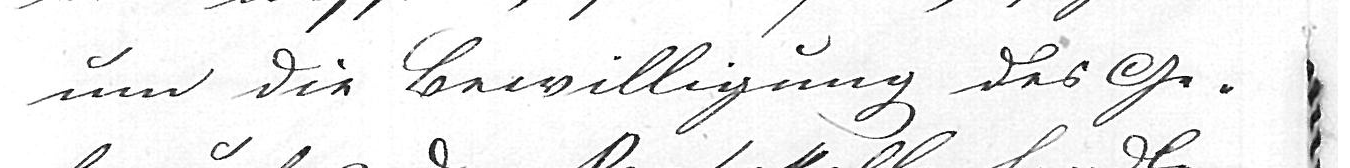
um die Bewilligung des Ge-
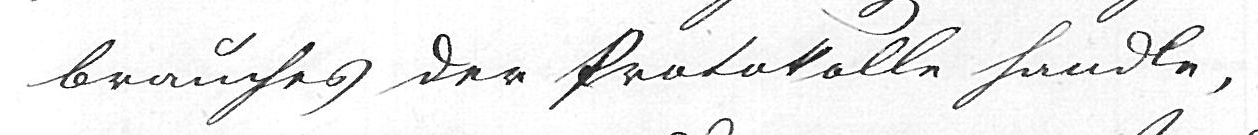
brauches der Protokolle handle,
